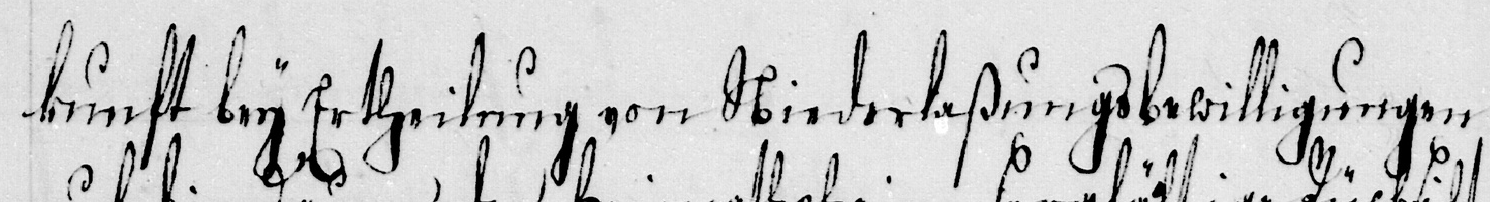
kunft bey Ertheilung von Niederlaßungsbewilligungen
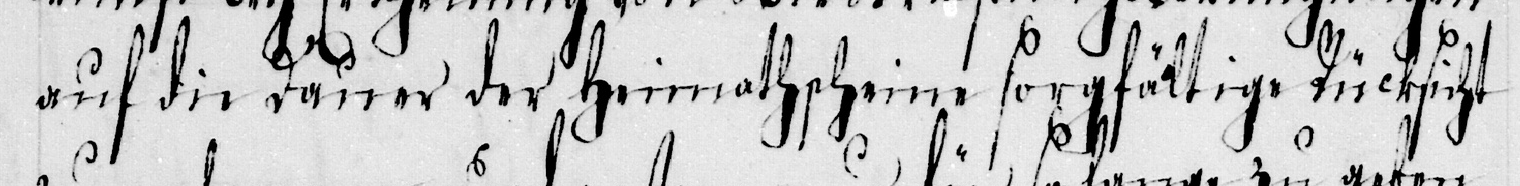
auf die Dauer der Heimathscheine sorgfältige Rücksicht
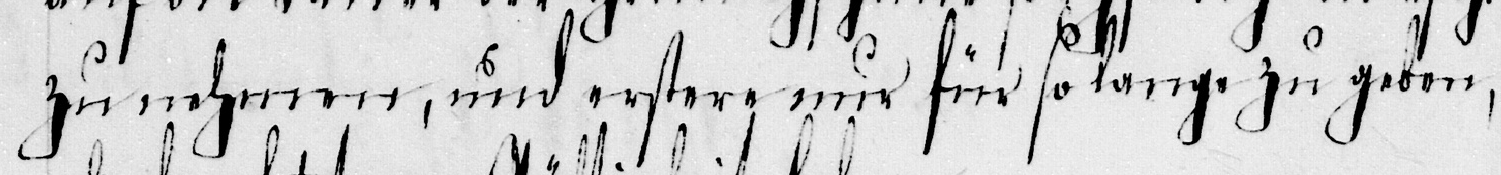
zu nehmen, und erstere nur für so lange zu geben,
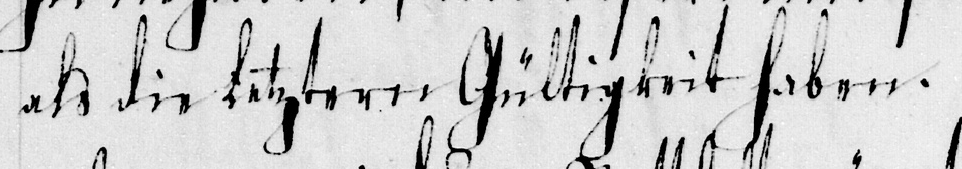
als die Letztern Gültigkeit haben.
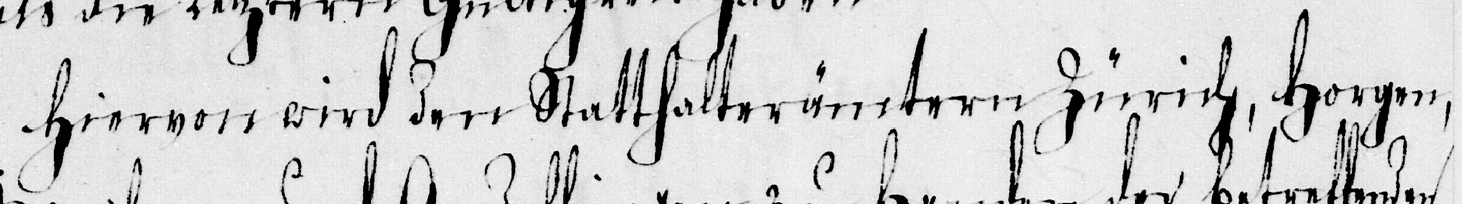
Hiervon wir den Statthalterämtern Zürich, Horgen,
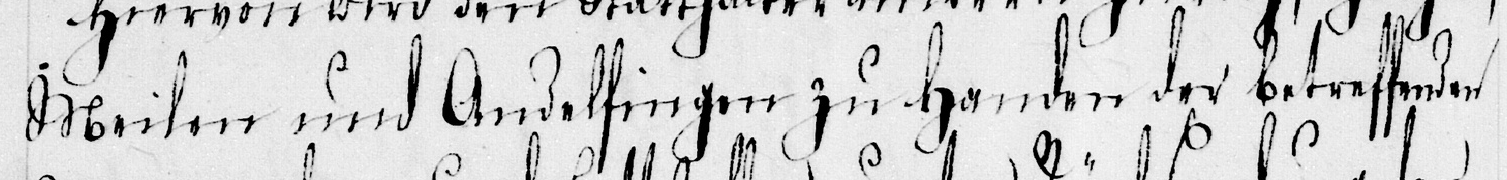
Meilen und Andelfingen zu Handen der betreffenden
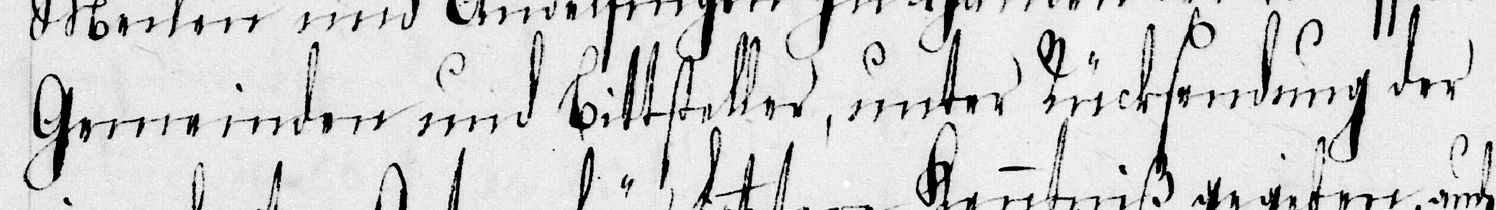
Gemeinden und Bittsteller, unter Rücksendung der
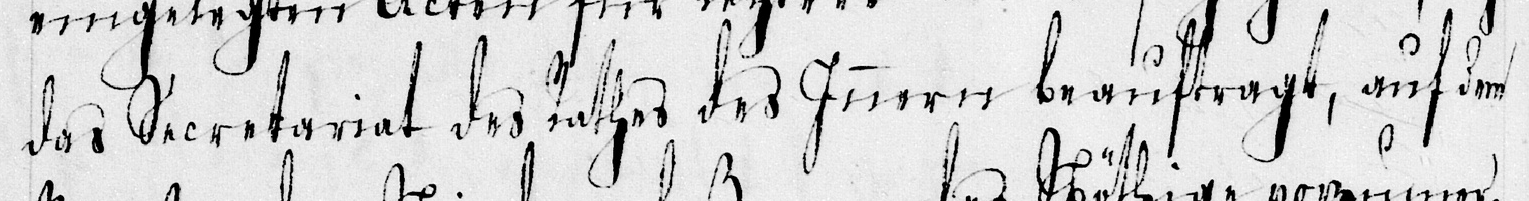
das Secretariat des Rathes des Innern beauftragt, auf dem
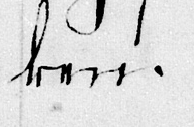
ken.
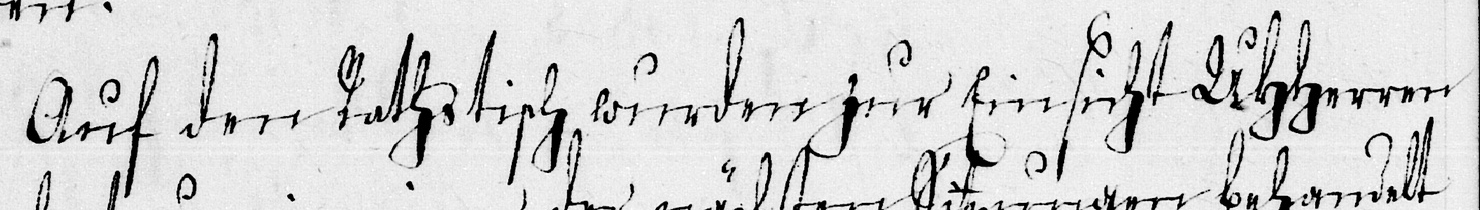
Auf den Rathstisch wurden zur Einsicht UHHerren
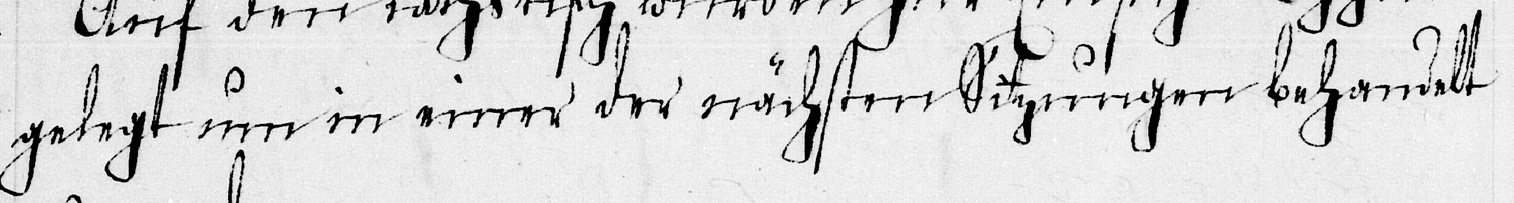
gelegt um in einer der nächsten Sitzungen behandelt
